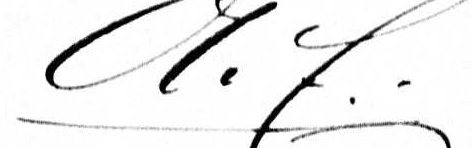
A. E.
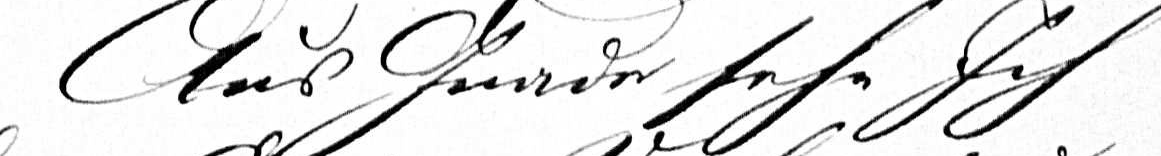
Aus Gnade sehe Jch
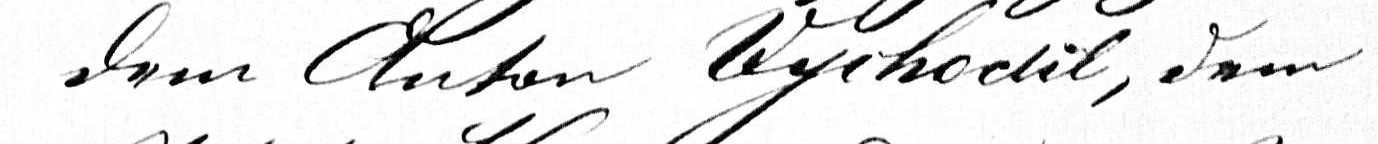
dem Anton Vychodil, dem
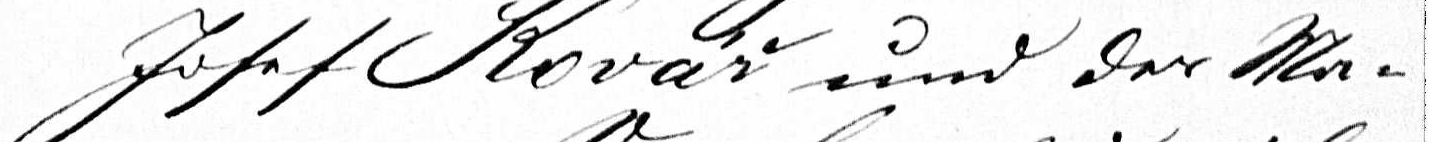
Josef Kovár und der Ma¬
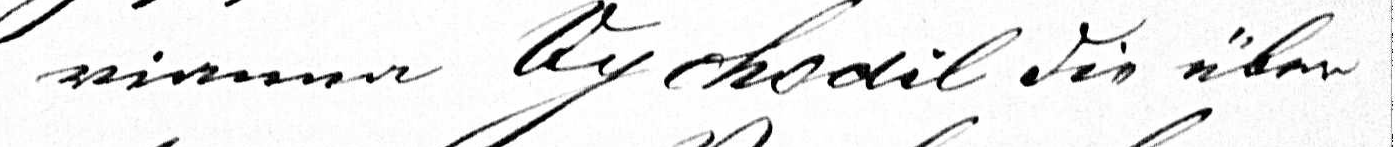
rianna Vychodil die über
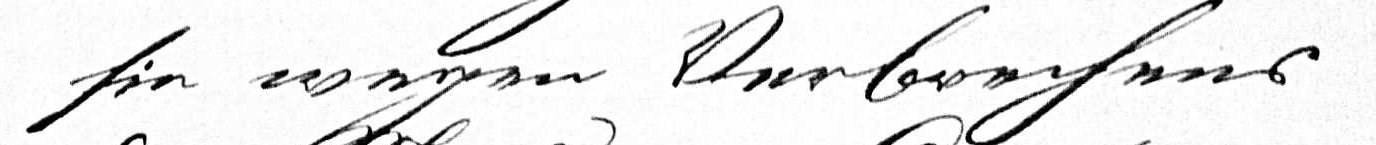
sie wegen Verbrechens
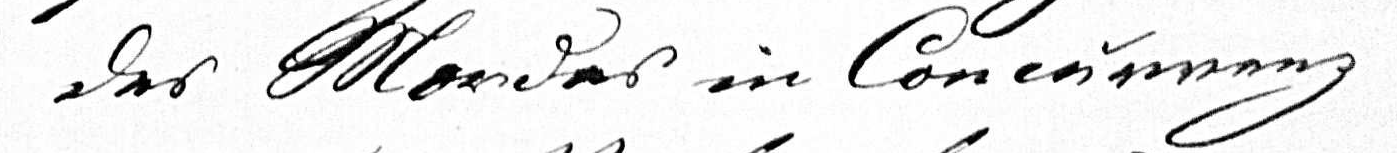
des Mordes in Concurrenz
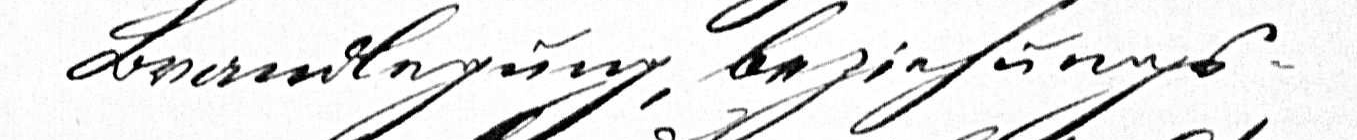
Brandlegung, beziehungs¬
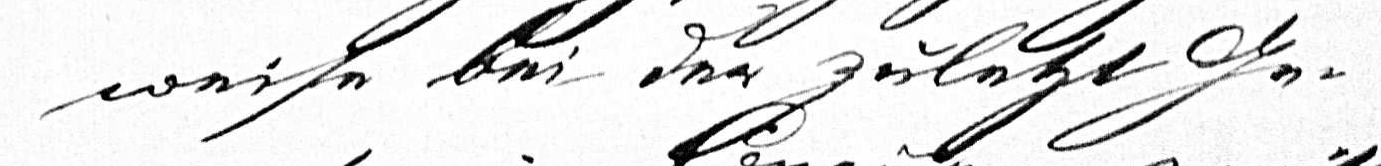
weise bei der zuletzt Ge¬
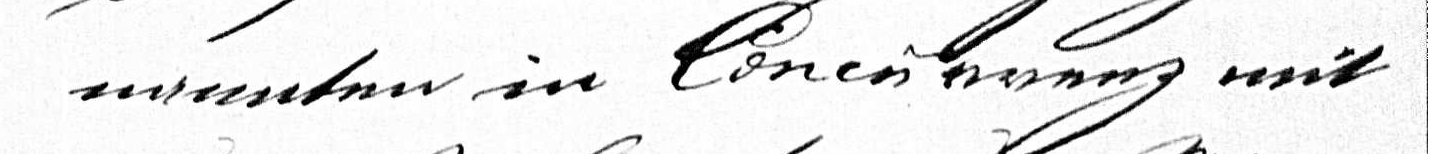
nannten in Concurrenz mit
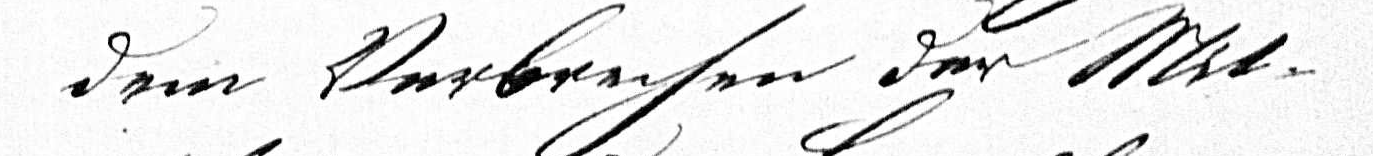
dem Verbrechen der Mit¬
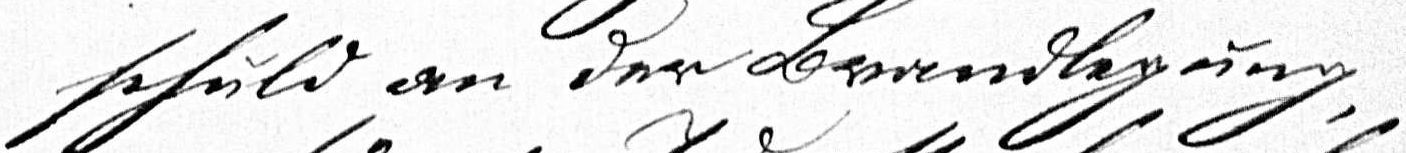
schuld an der Brandlegung,
